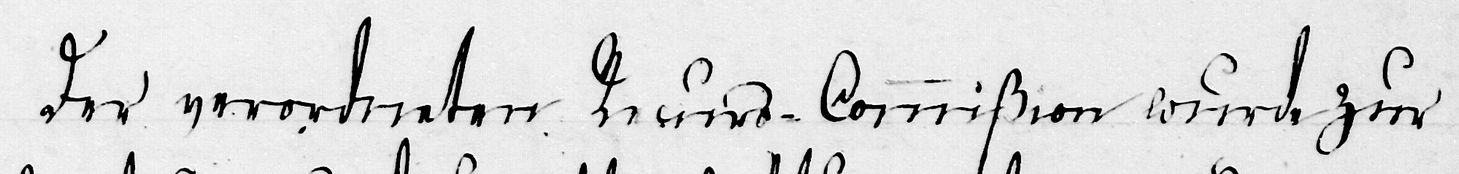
Der verordneten Recurs-Commißion wurde zur
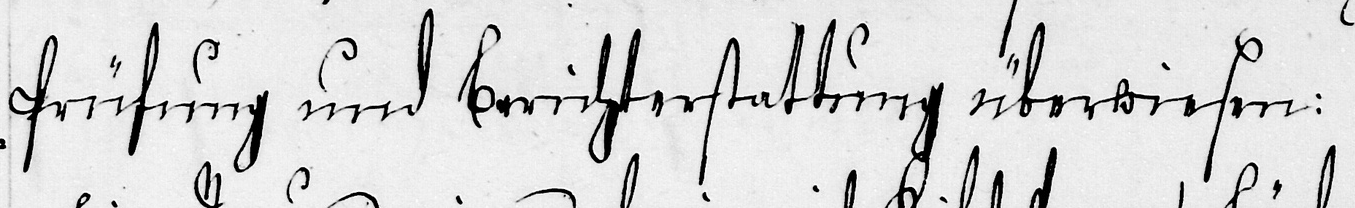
Prüfung und Berichterstattung überwiesen:
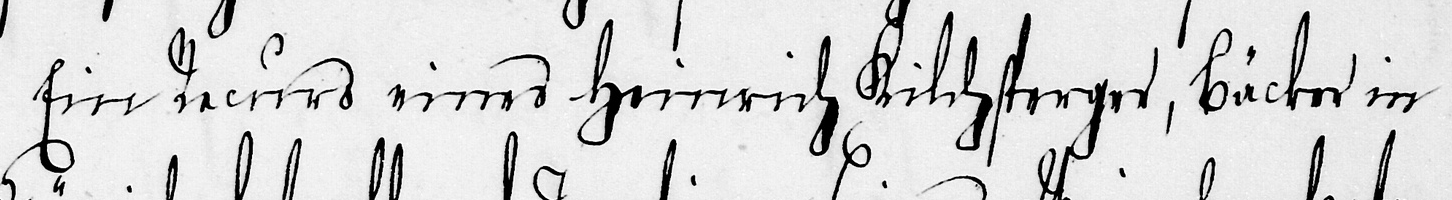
Ein Recurs eines Heinrich Kilchsperger, Bäcker in
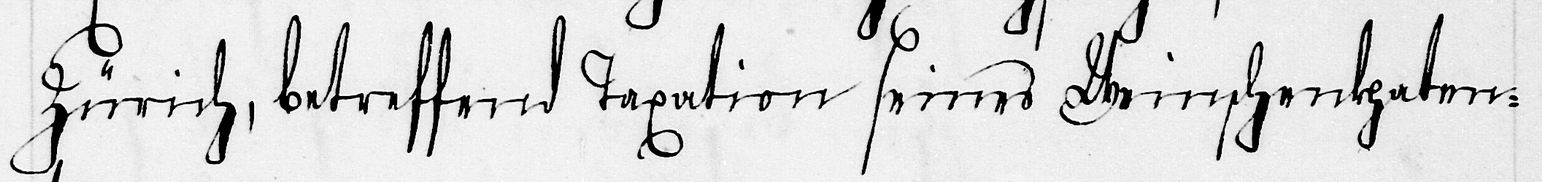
Zürich, betreffend Taxation seines Weinschenkpaten¬
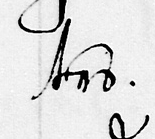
tes.
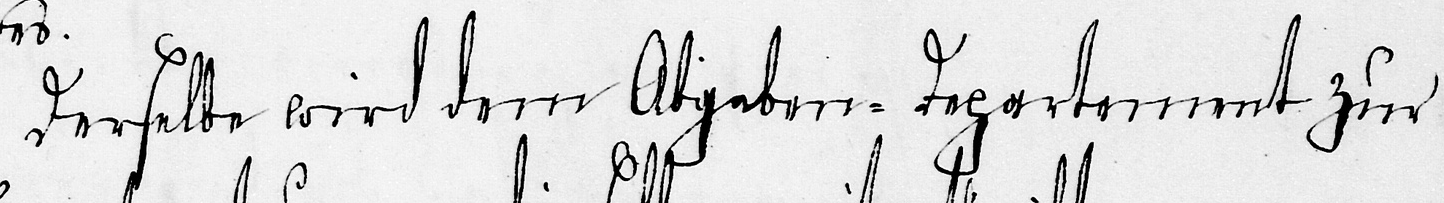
Derselbe wird dem Abgaben-Departement zur
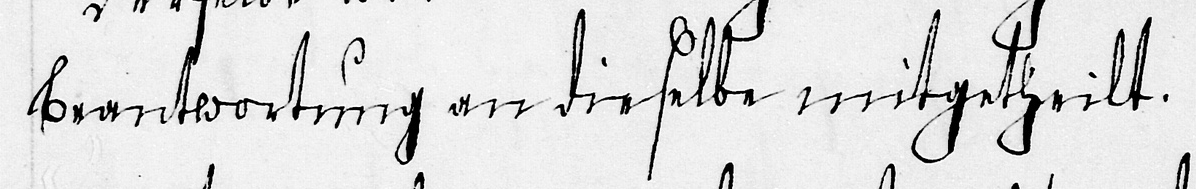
Beantwortung an dieselbe mitgetheilt.
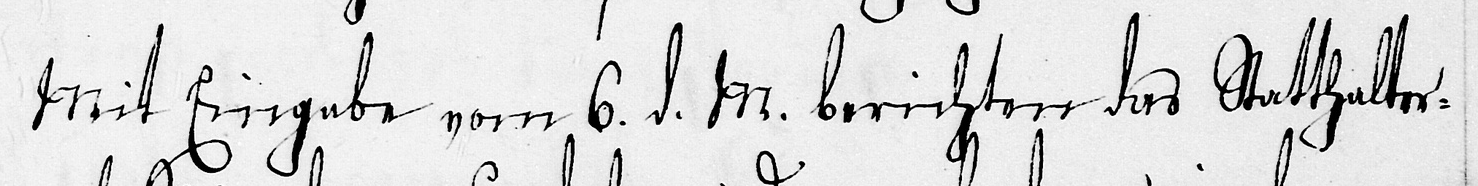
Mit Eingabe vom 6. d. M. berichten das Statthalte¬
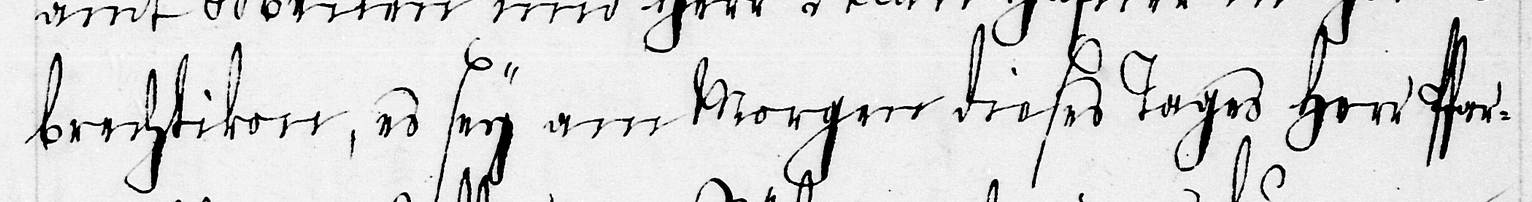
brechtikon, es sey am Morgen dieses Tages Herr Pfar¬
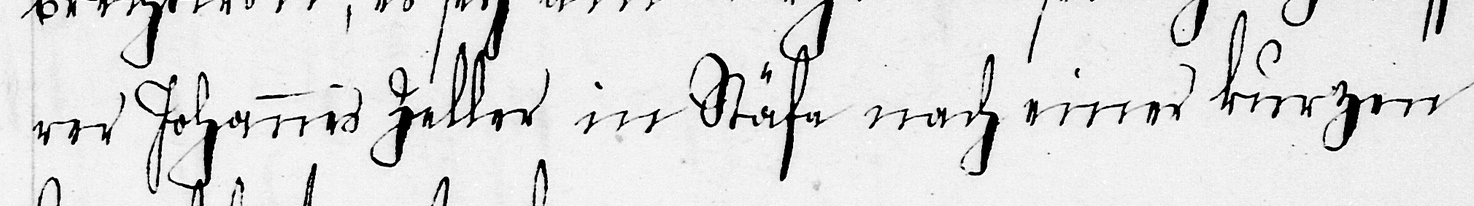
rer Johannes Zeller in Stäfa nach einer kurzen
